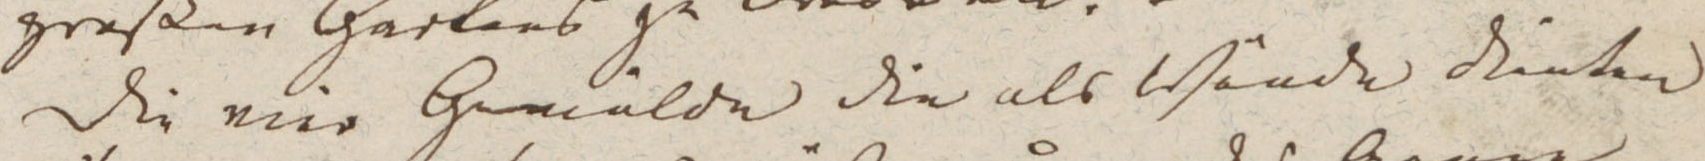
Die vier Gemälde die als Wände dienten
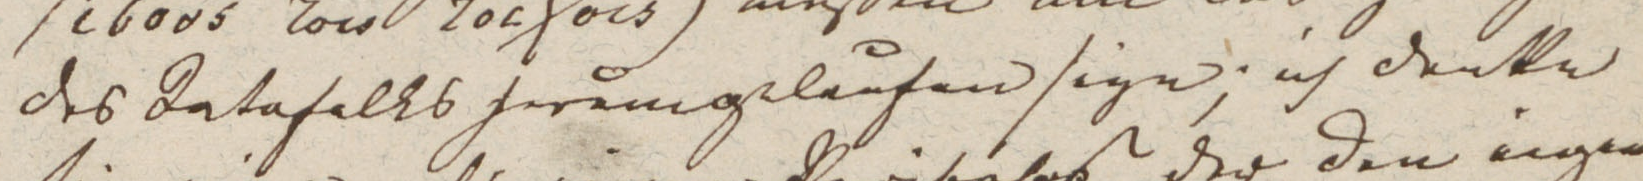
des Katafalks herumgelaufen seyn; ich denke
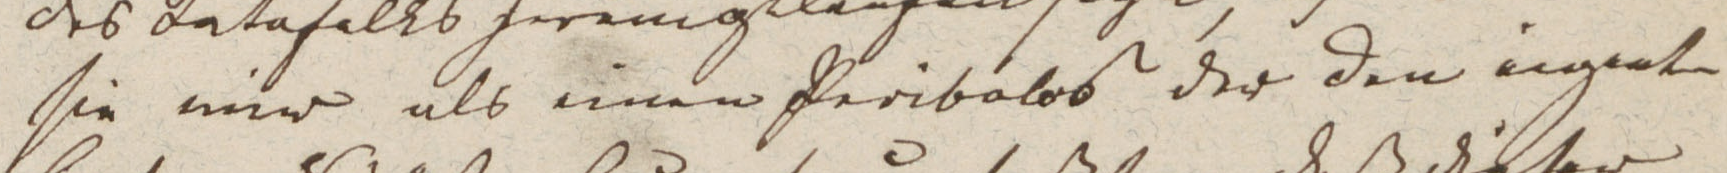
sie mir als einen Peribolos der den eigent-
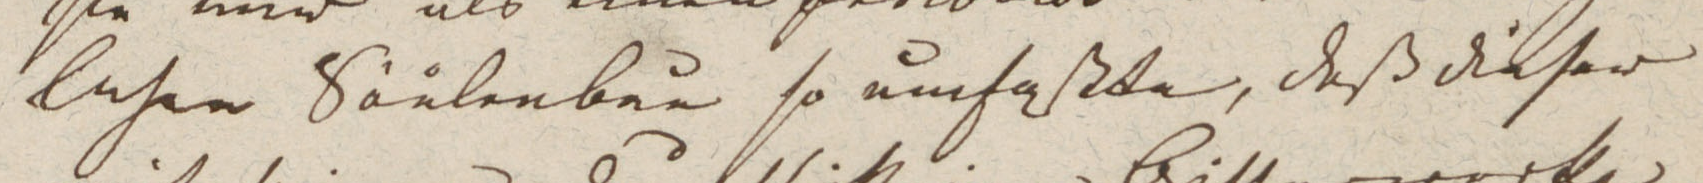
lichen Säulenbau so umfasste, dass dieser
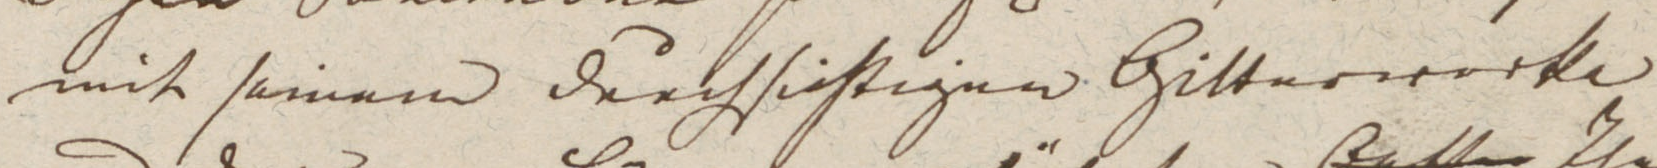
mit seinem durchsichtigen Gitterwerke
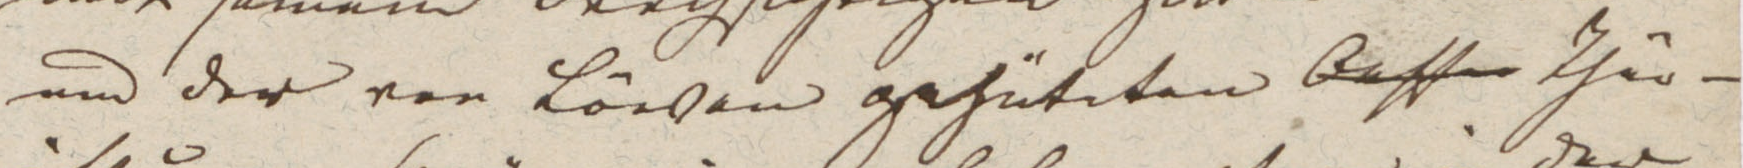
und der von Löwen gehüteten Off Thür-
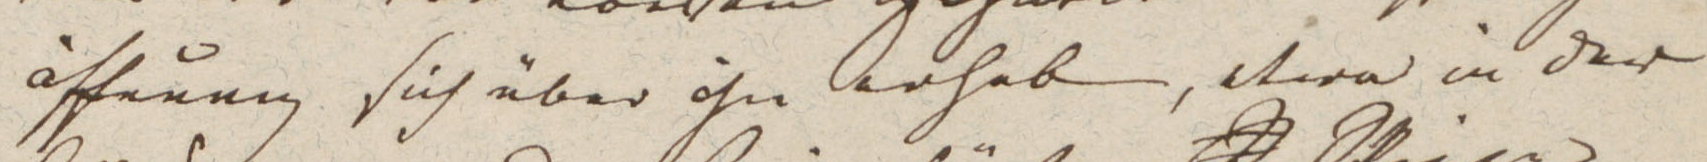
öffnung sich über ihn erhob, etwa in der
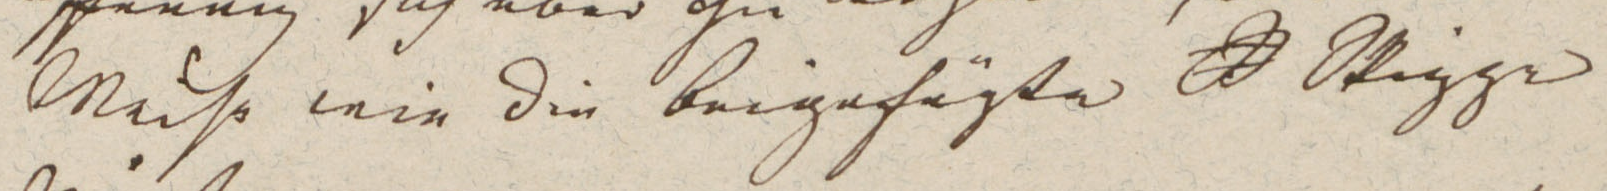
Weise wie die beigefügte S Skizze
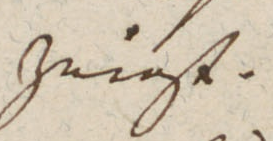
zeigt. –
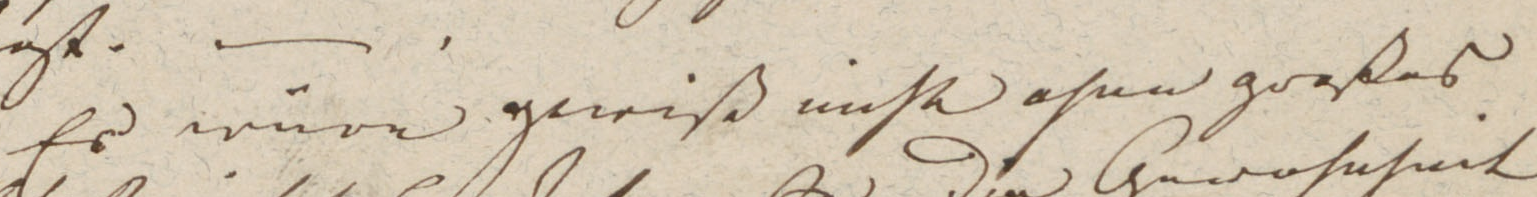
Es wäre gewiss nicht ohne grosses
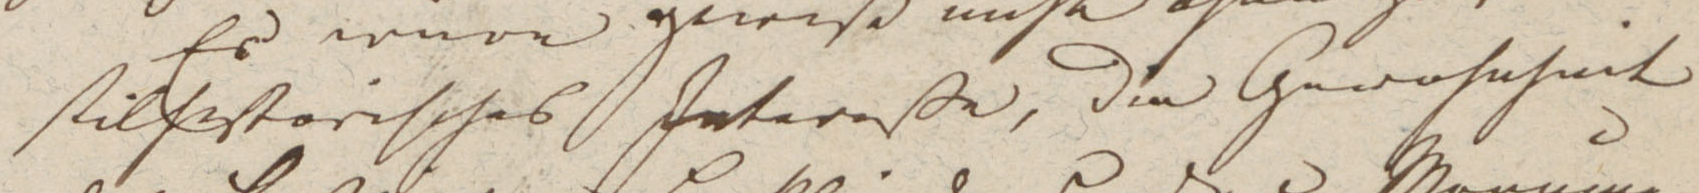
stilhistorisches Interesse, die Gewohnheit
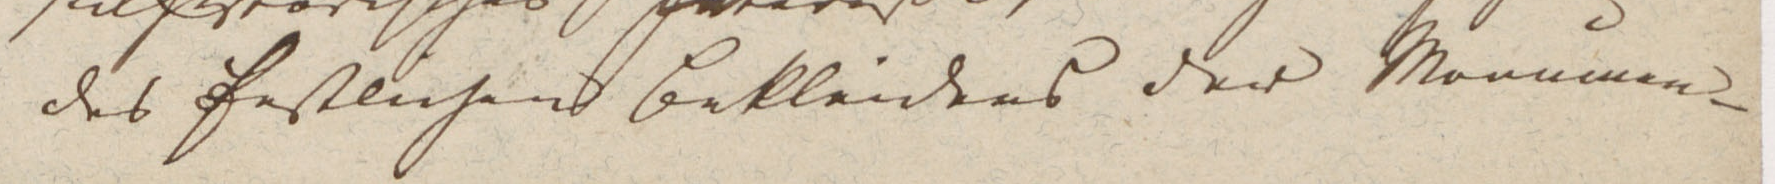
des festlichen Bekleidens der Monumen-
